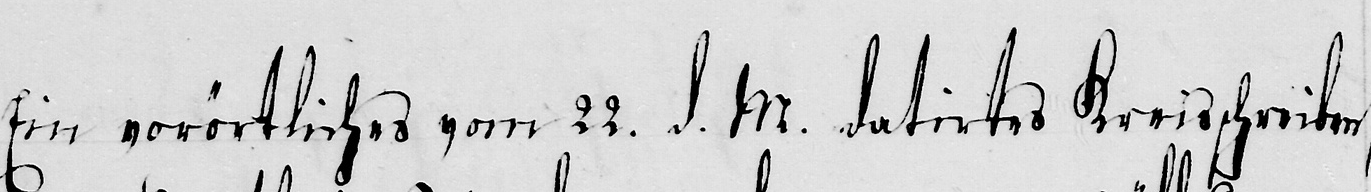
Ein vorörtliches vom 22. d. M. datirtes Kreisschreibe¬
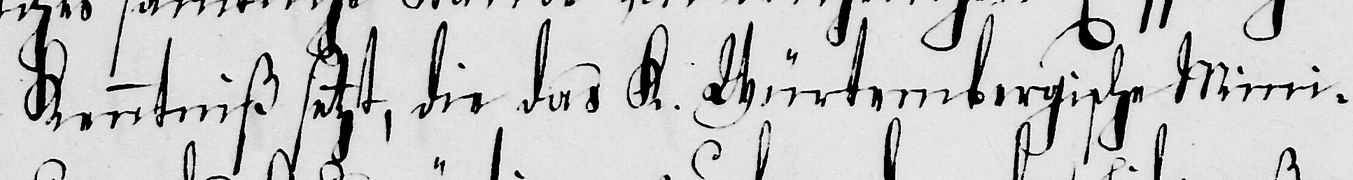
Kenntniß setzt, die das K. Würtembergische Mini¬
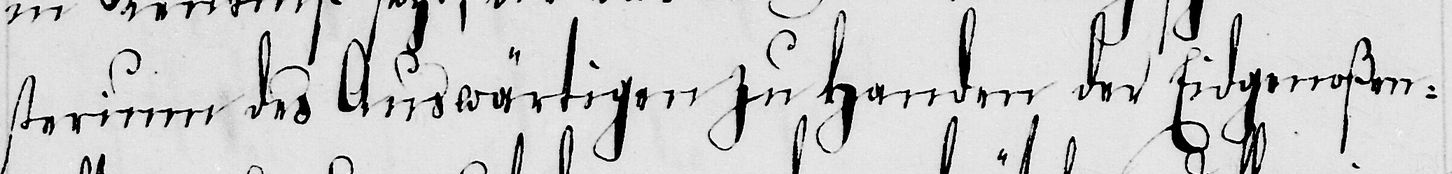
sterium des Auswärtigen zu Handen der Eidgenoßen¬
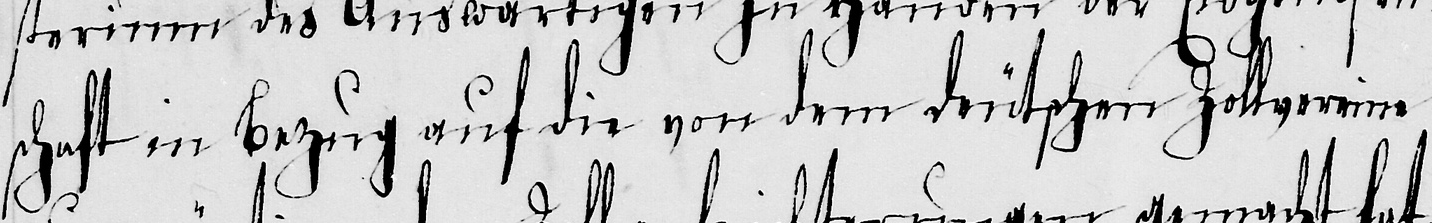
schaft in Bezug auf die von dem deutschen Zollverei¬
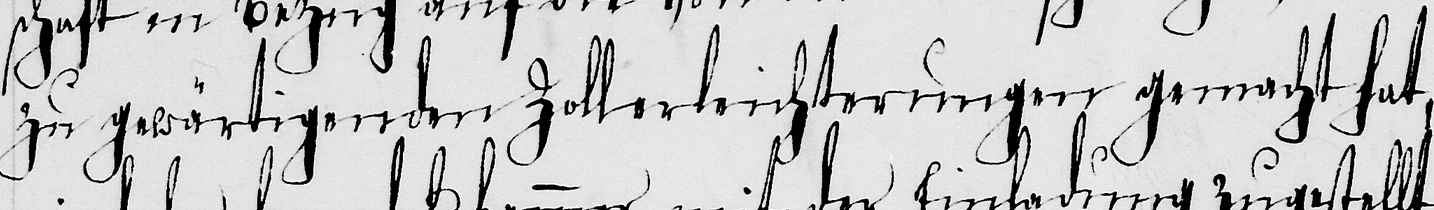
zu gewärtigenden Zollerleichterungen gemacht hat,
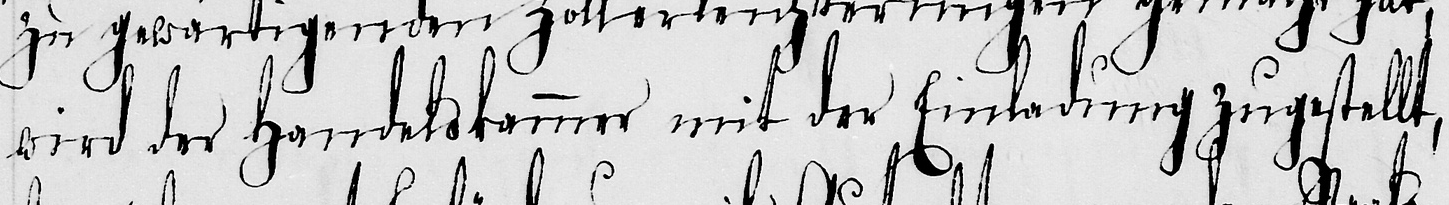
wird der Handelskammer mit der Einladung zugestellt,
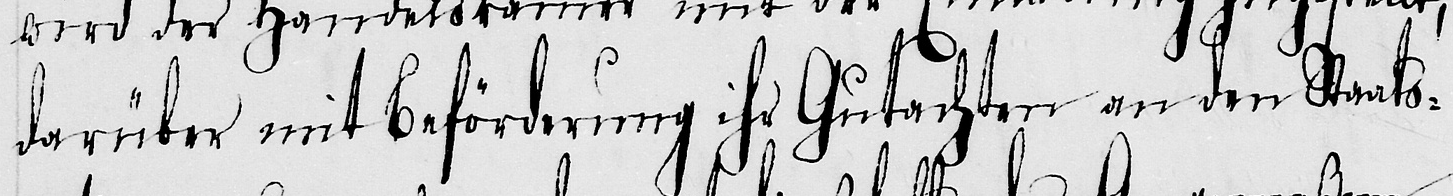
darüber mit Beförderung ihr Gutachten an den Staat¬
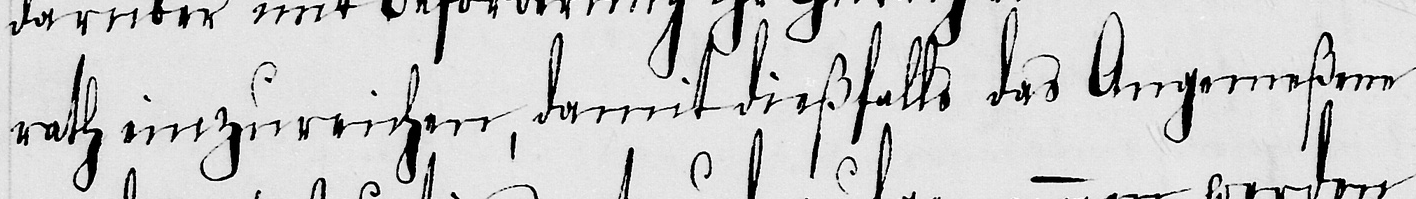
srath einzureichen, damit dießfalls das Angemeßene
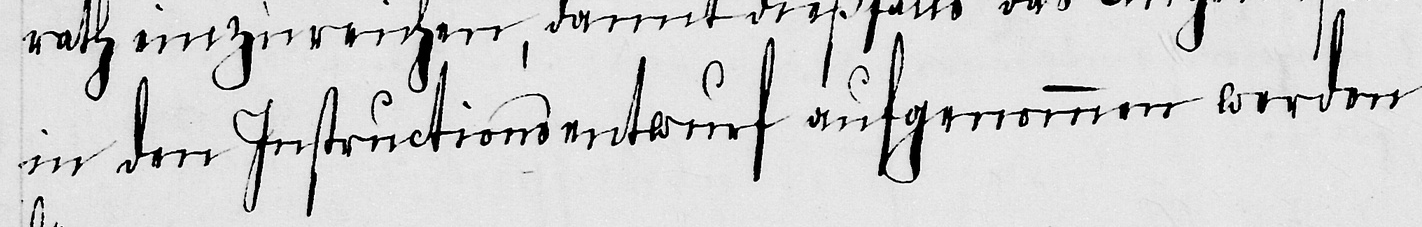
in den Instructionsentwurf aufgenommen werden
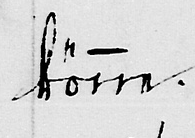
könne.
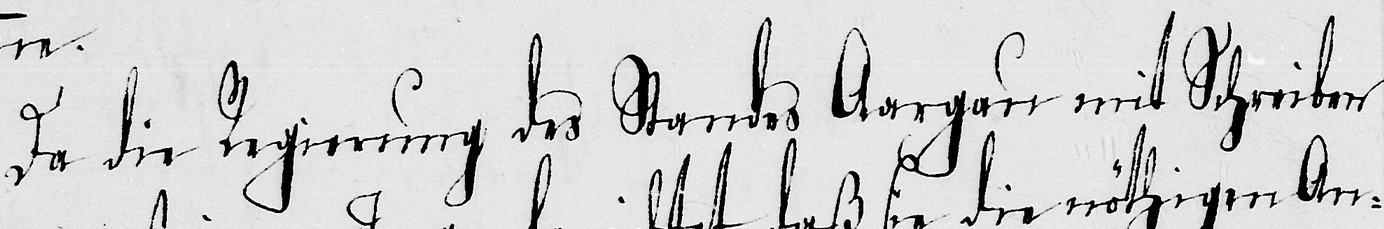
Da die Regierung des Standes Aargau mit Schreiben
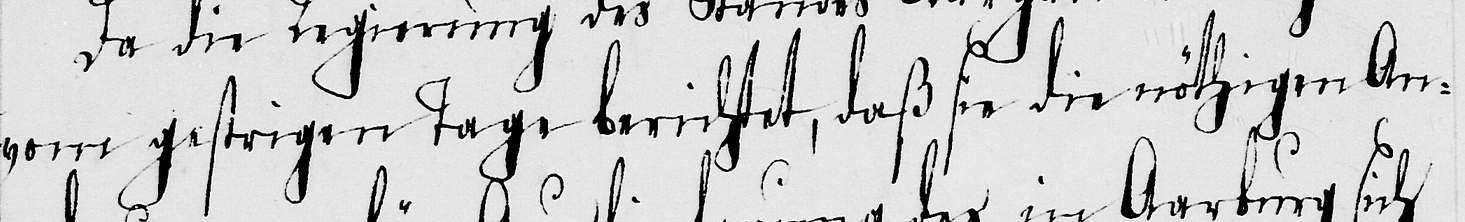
vom gestrigen Tage berichtet, daß sie die nöthigen An¬
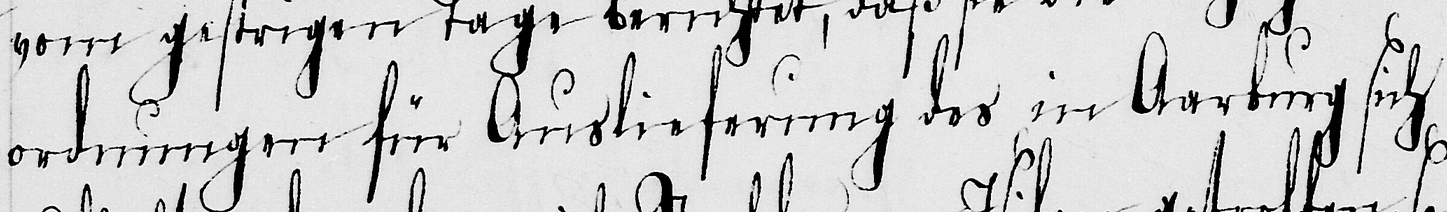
ordnungen für Auslieferung des in Aarburg sich
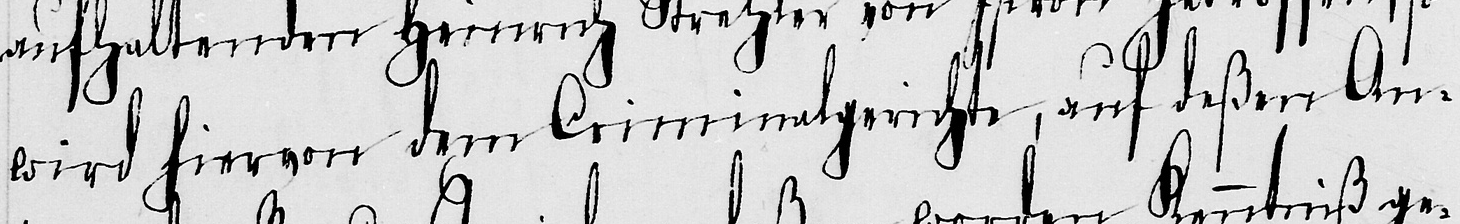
wird hiervon dem Criminalgerichte, auf deßen An¬
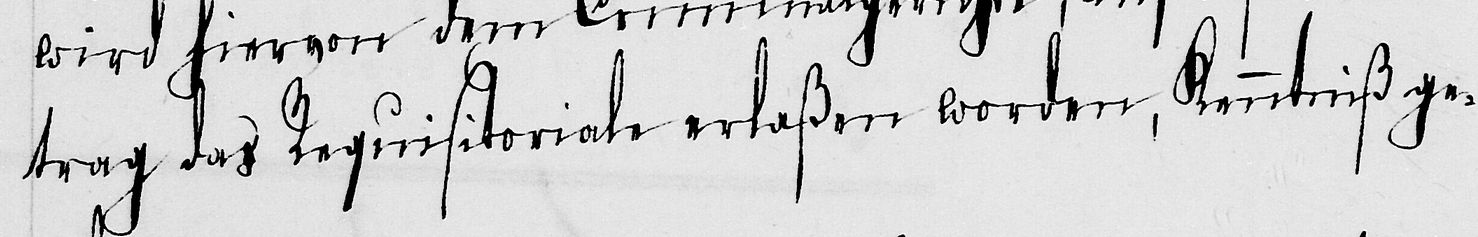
trag das Requisitoriale erlaßen worden, Kenntniß ge¬
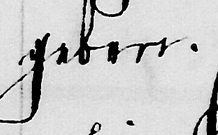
geben.
